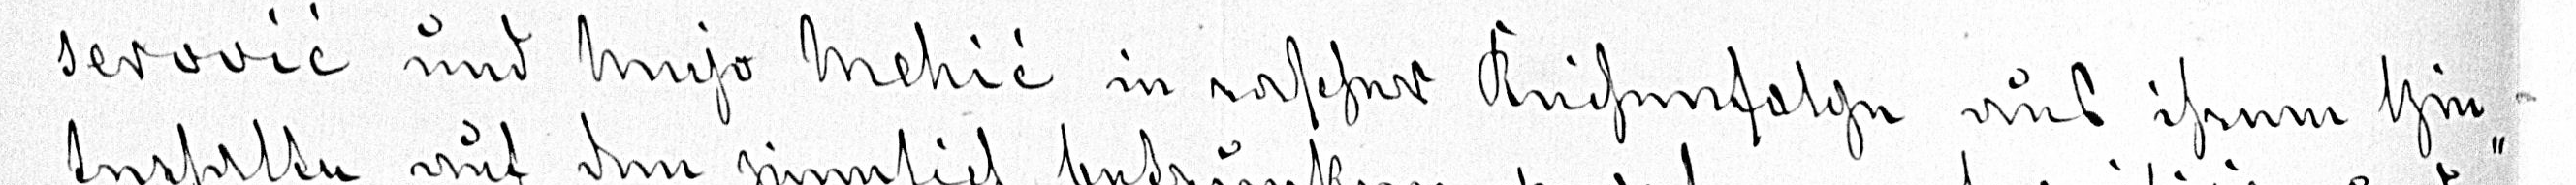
serović und Mujo Mehić in rascher Kirchenfolge aus ihrem Hin¬
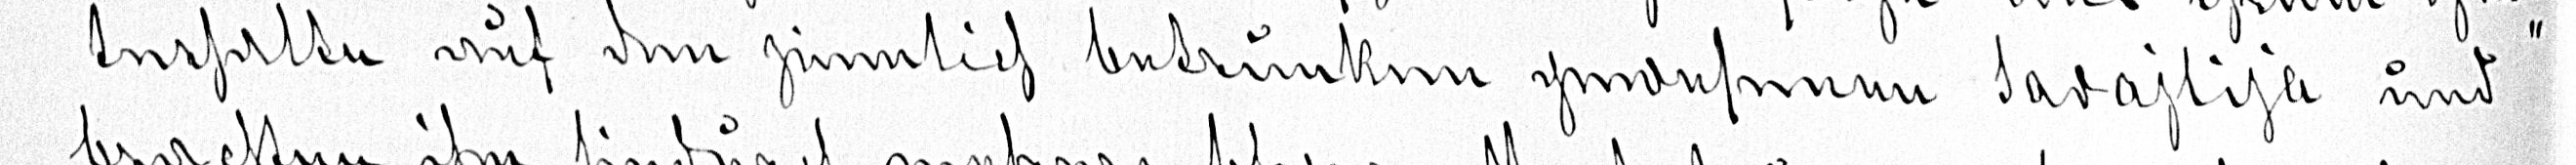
terhatte auf den ziemlich betrunkenn gewesenen Savajlija und
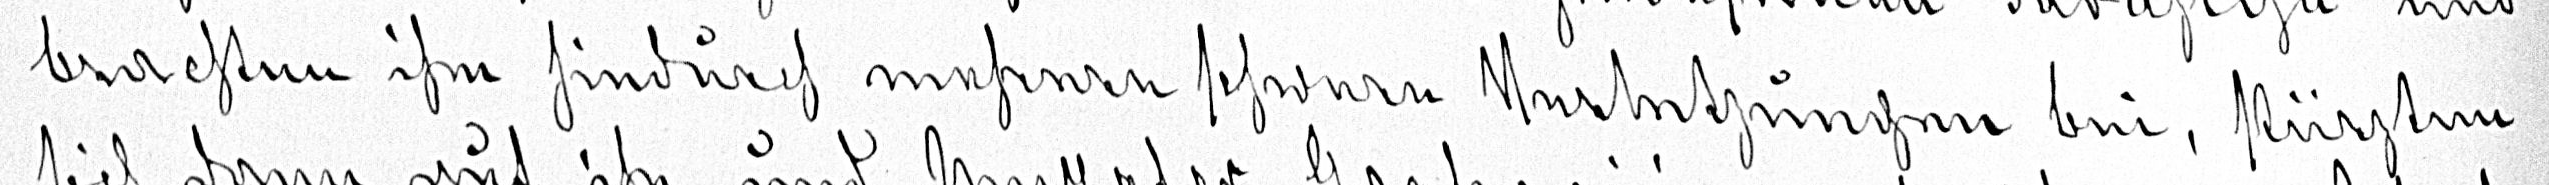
brachten ihm hindurch mehrere schwere Verletzungen bei, stürzten
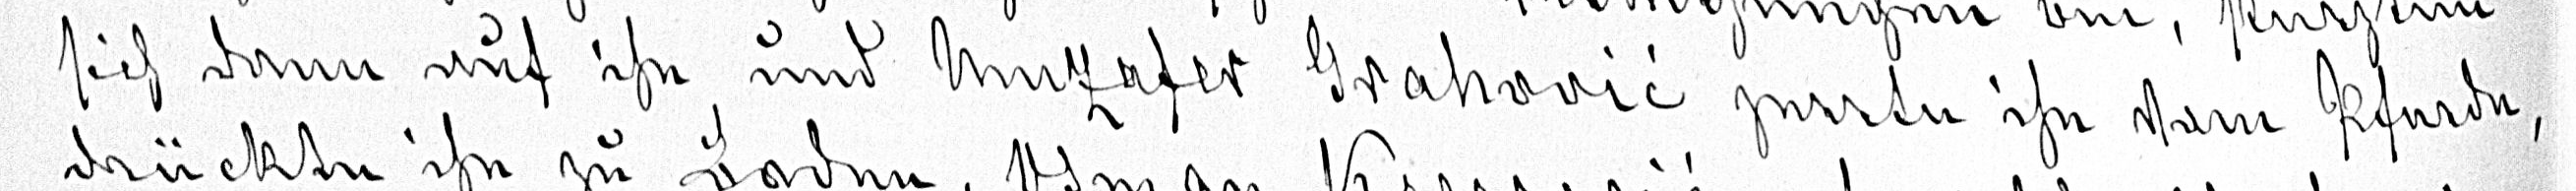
sich dann auf ihn und Muzafer Grahović zerrte ihn vom Pferde,
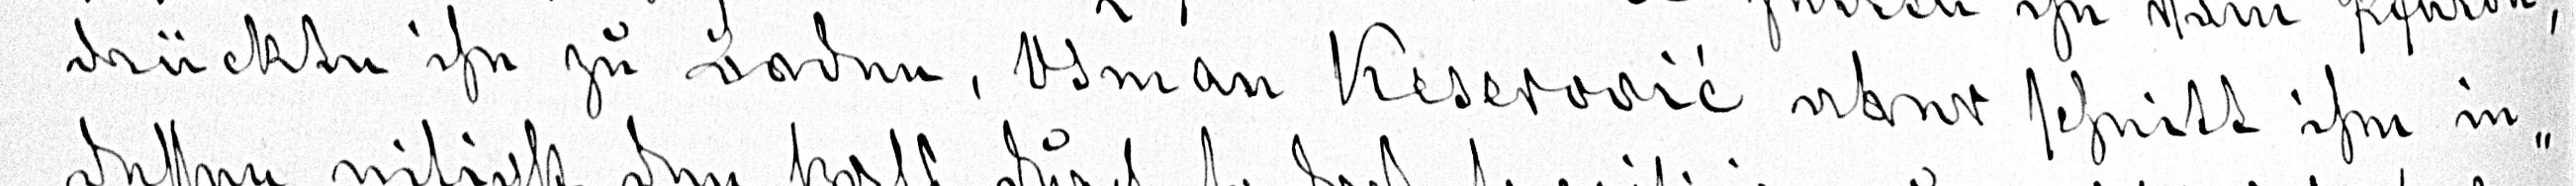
drückte ihn zu Boden, Osman Keserović aber schnitt ihm in¬
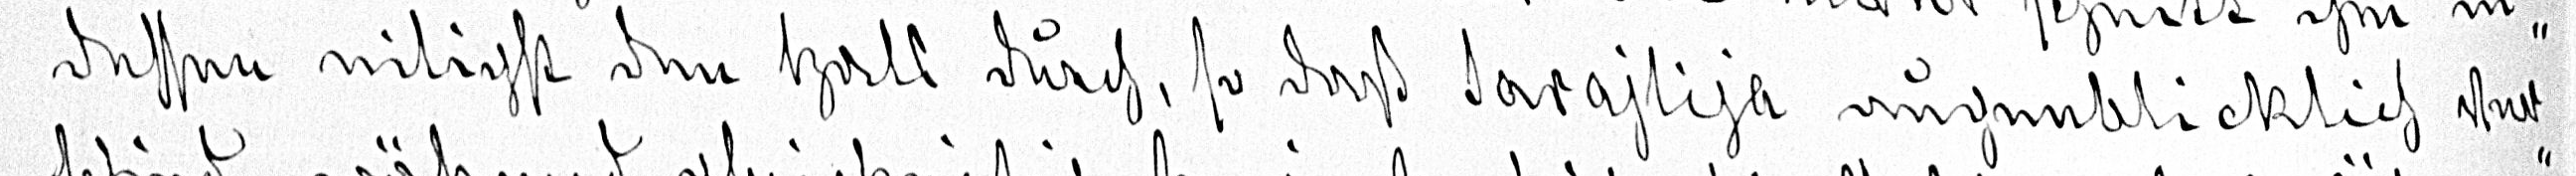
dessen eiligst den Hals durhc, so daß Sarajlija augenblicklich ver¬
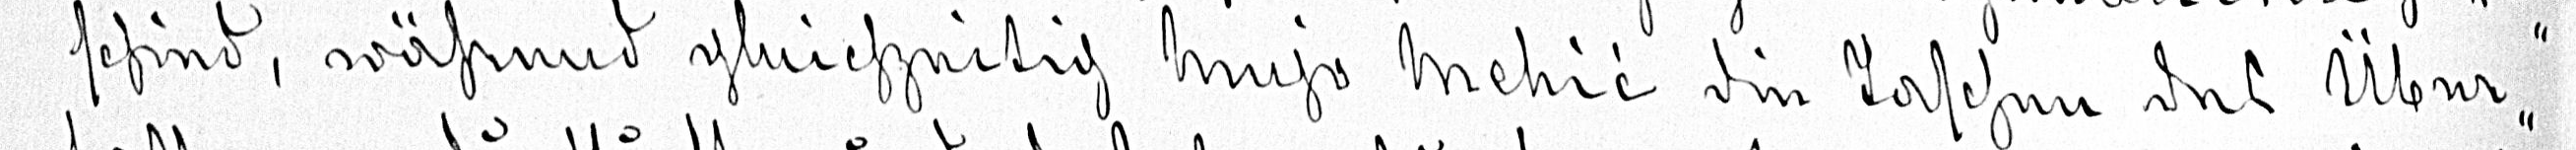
schind, während gleichzeitig Mujo Mehić die Taschen des Über¬
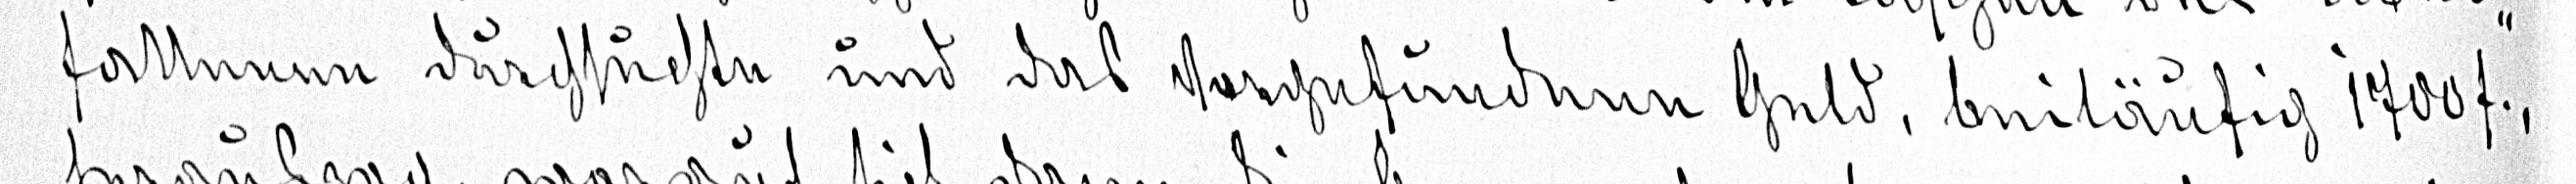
fallenen durchsuchte und das vorgefundene Geld, beiläufig 1700 f.,
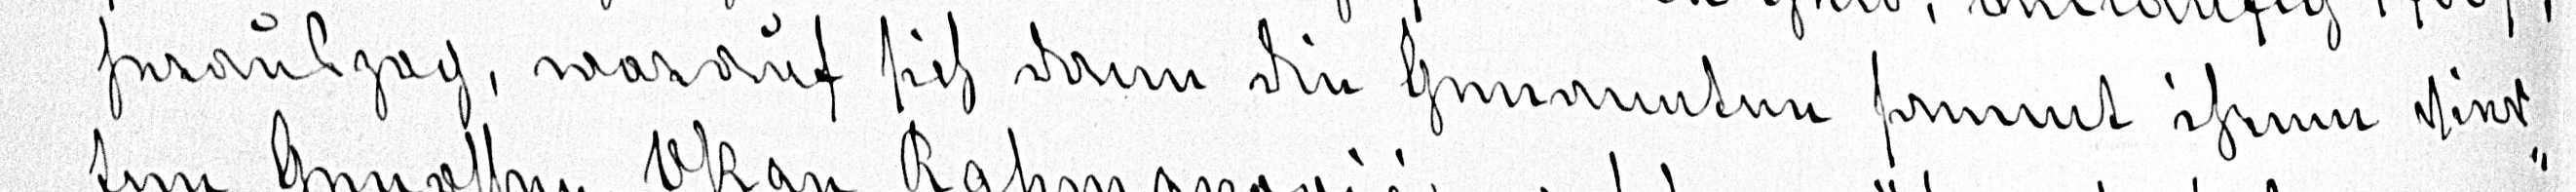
herauszog, worauf sich dann die Genannten sammt ihrem vier¬
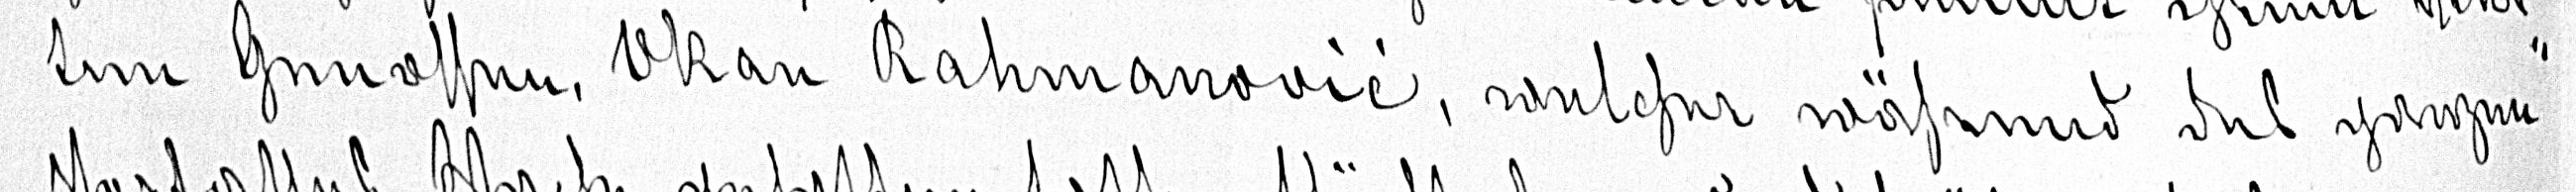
ten Genossen, Okan Rahmanović, welcher während des ganzen
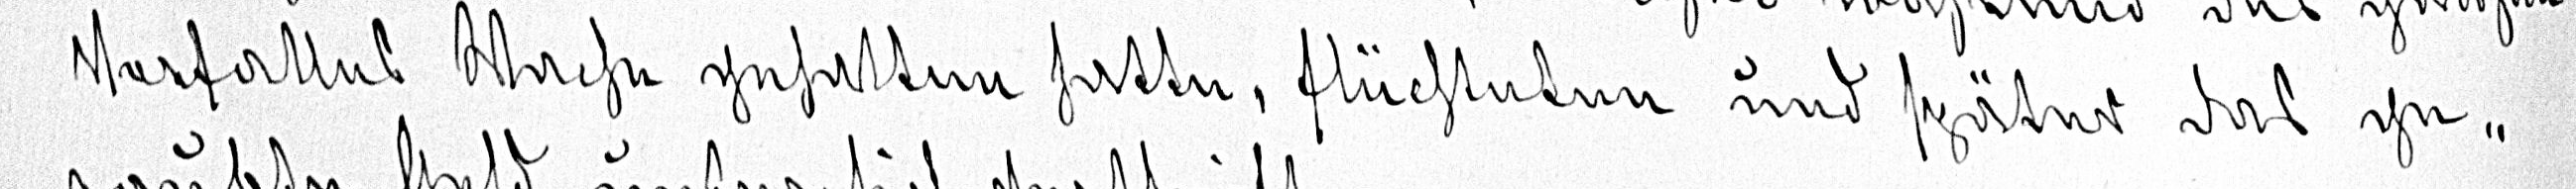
Verfalles Wache gehalten hatte, flüchteten und später das ge¬
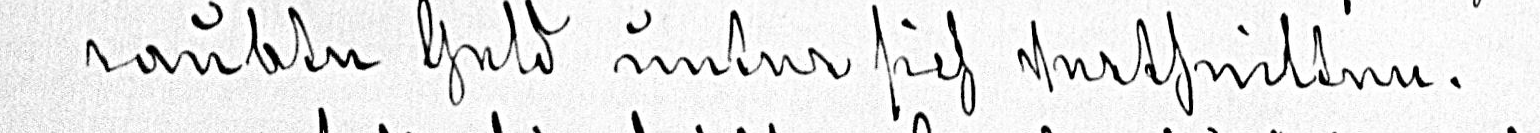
raubte Geld unter sich vertheilten.
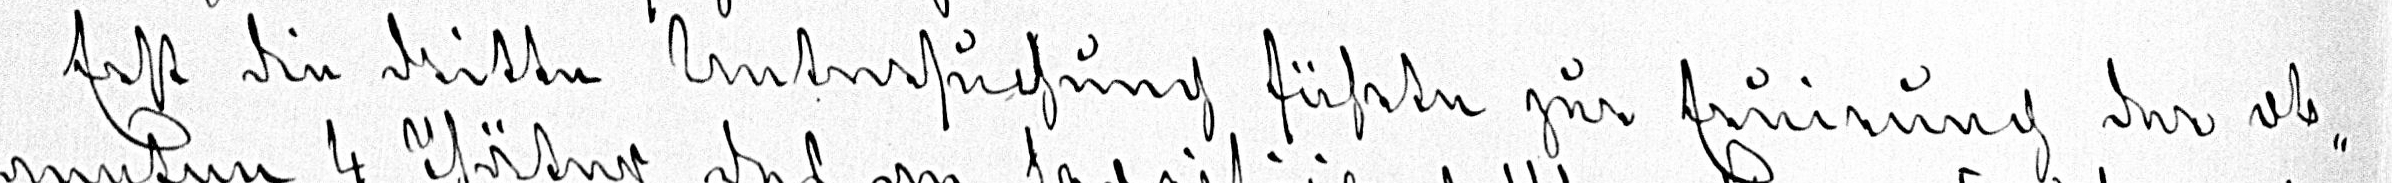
Erst die dritte Untersuchung führte zur Eruirung der ob¬
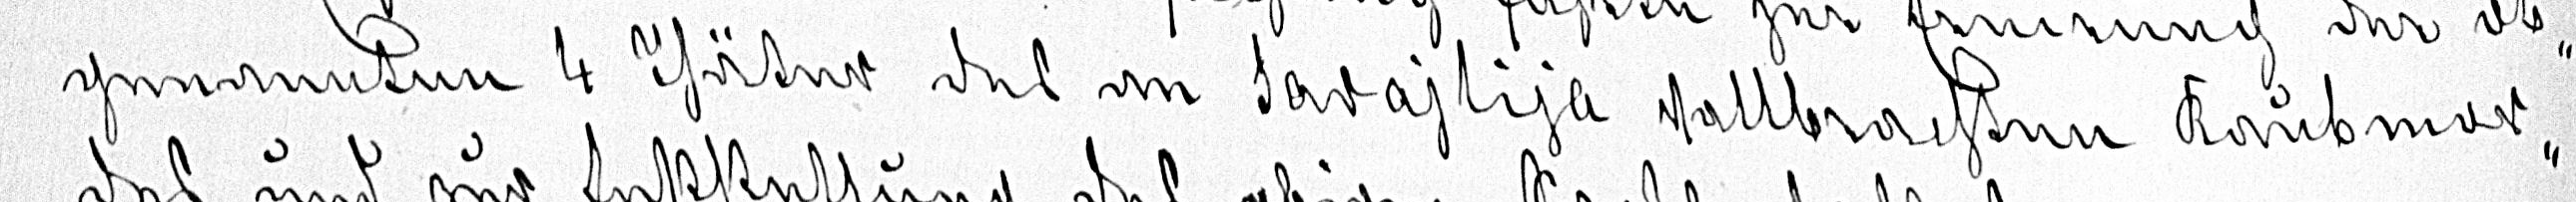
genannten 4 Thäter des an Savajlija vollbrachten Raubmor¬
